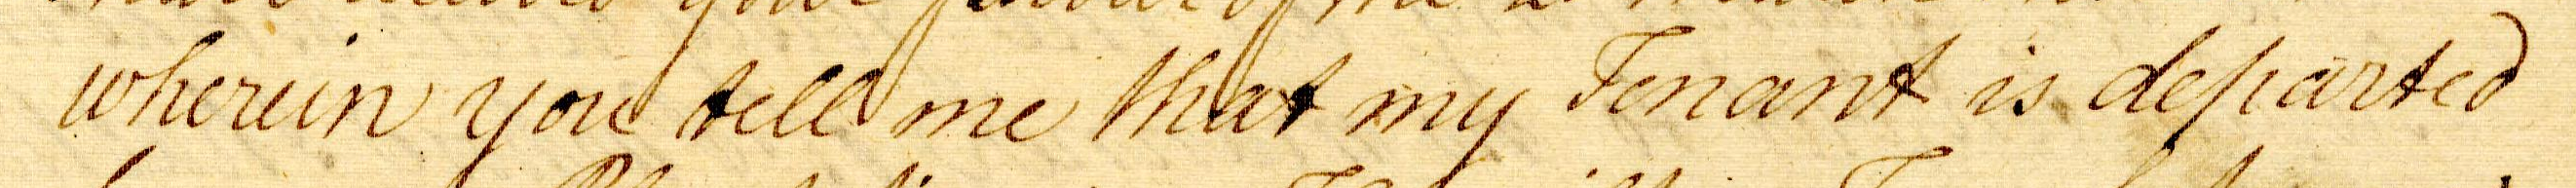wherein you tell me that my Tenant is departed
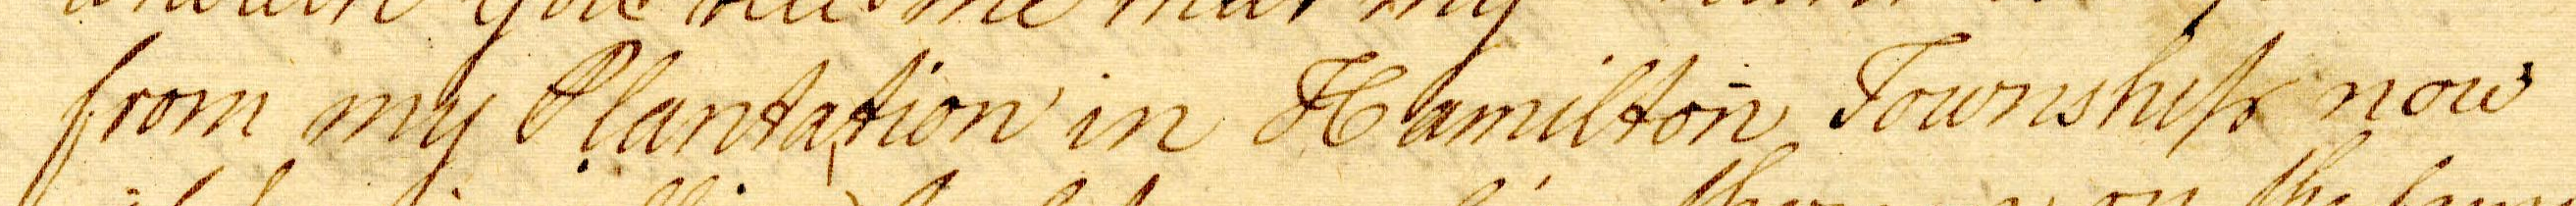from my Plantation in Hamilton Township now
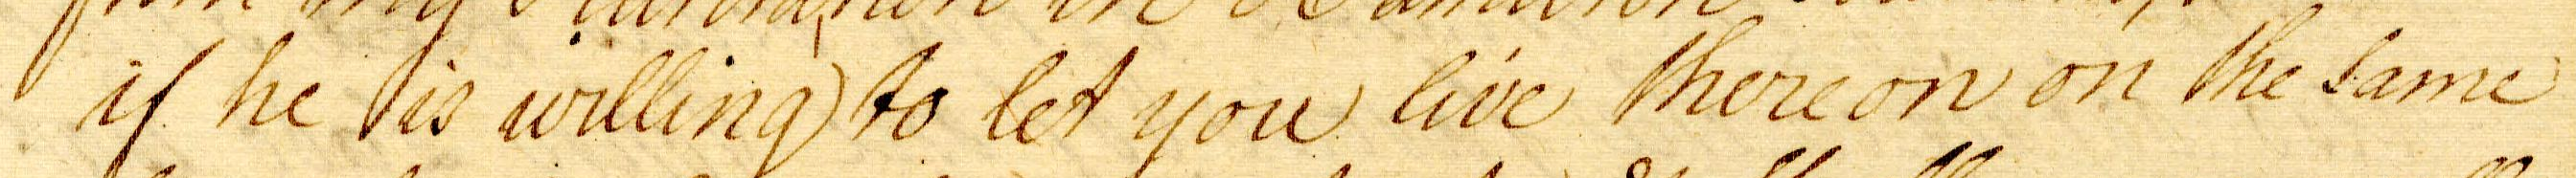if he is willing to let you live there on on the same
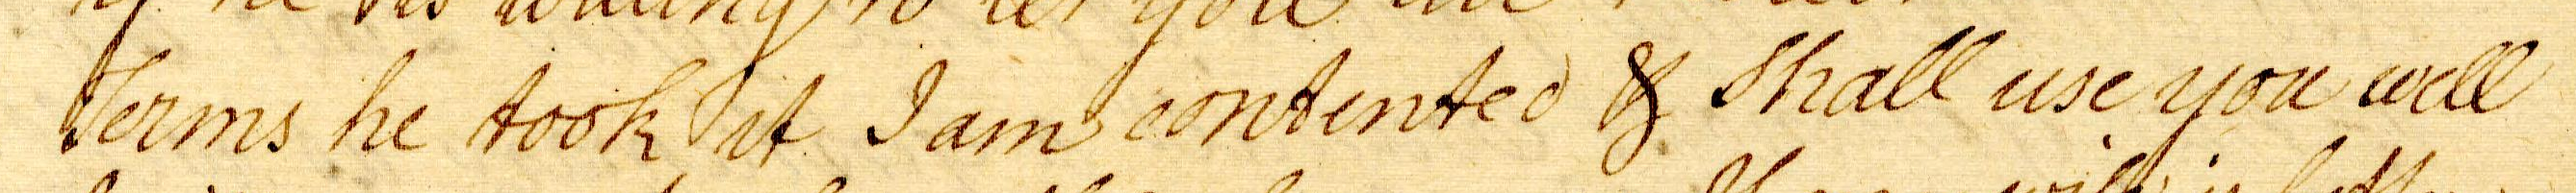terms he took it I am contented & shall use you well
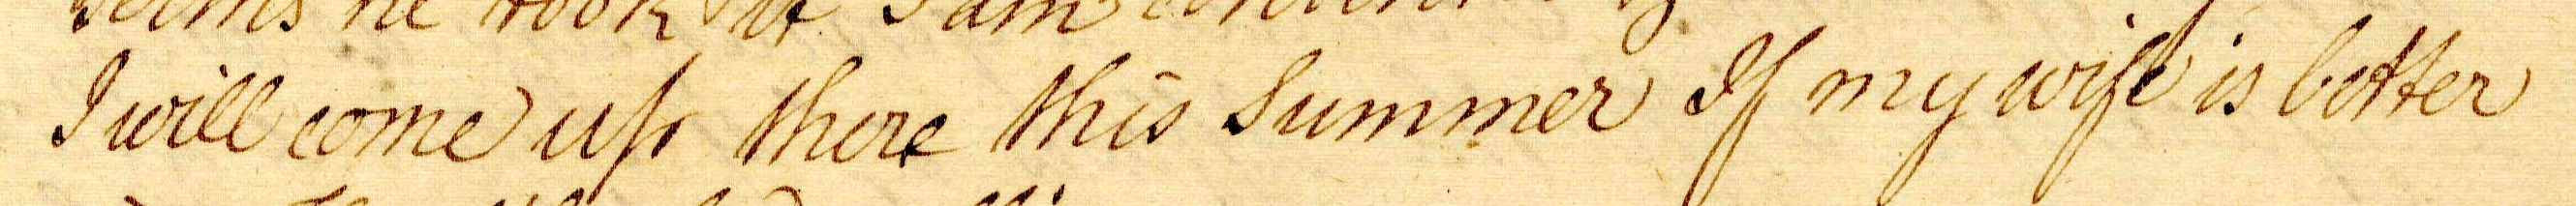I will come up there this Summer If my wife is better
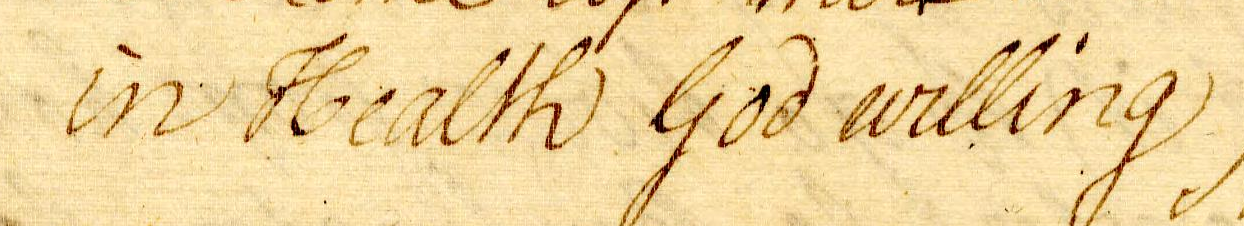in Health God willing
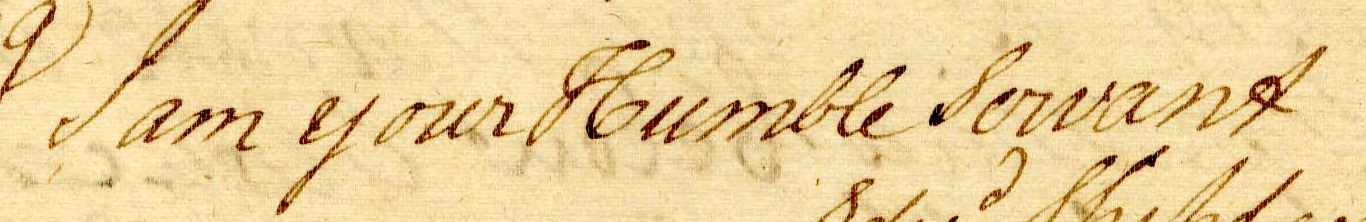I am your Humble Servant
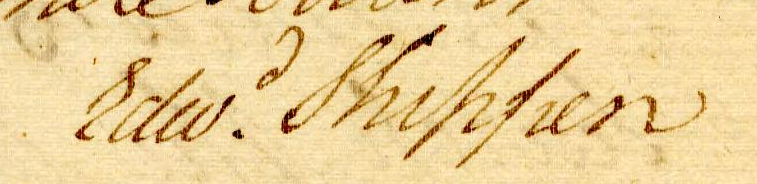Edw.^d Shippen
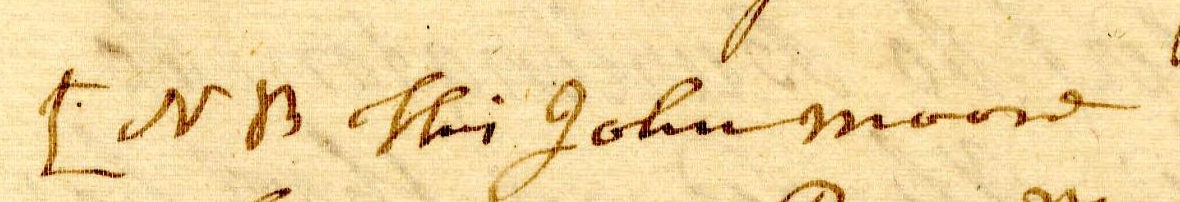(NB this John Moore
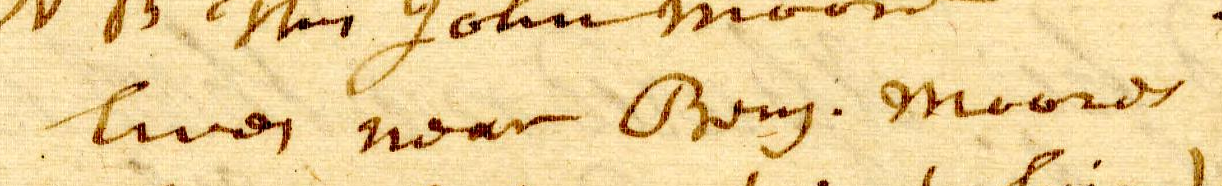lives near Benj. Moores
